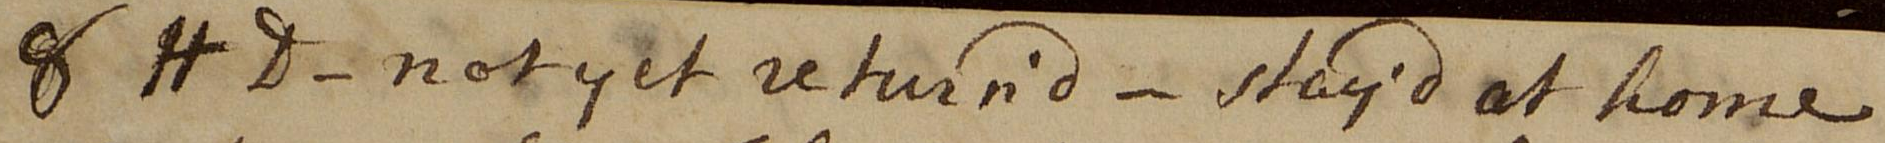8 HD- not yet return'd- stay'd at home
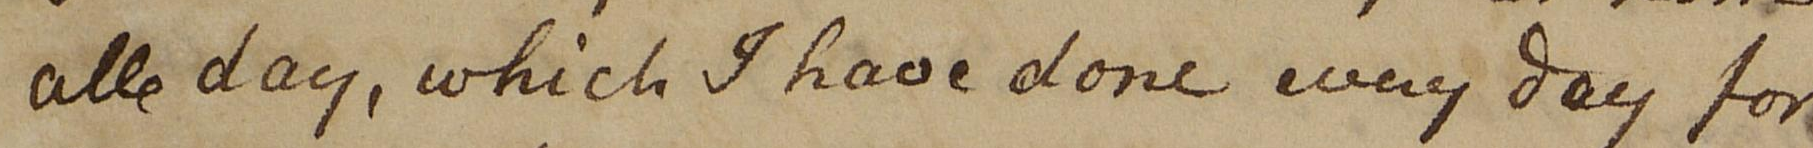all day, which I have done every day for
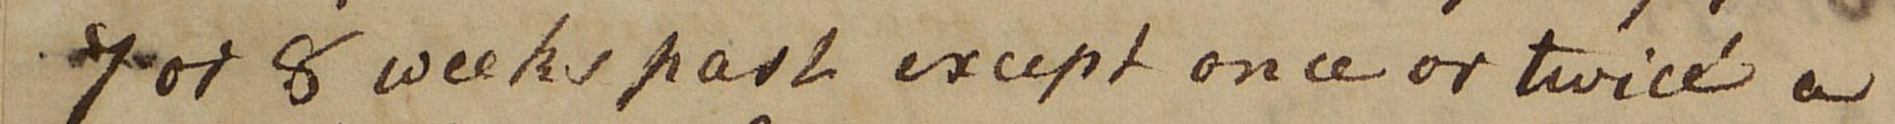7 or 8 weeks past except once or twice a
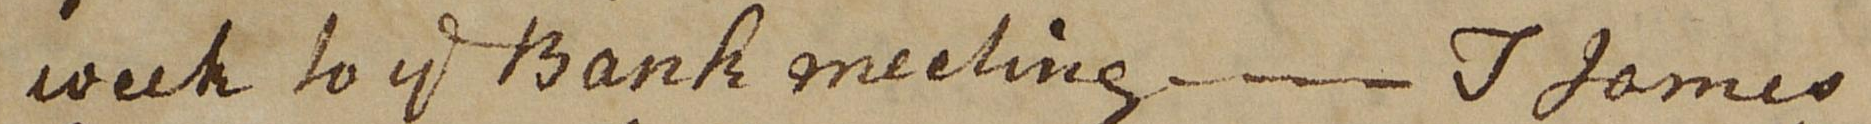week to y^e Bank meeting-- T James
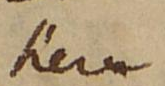here
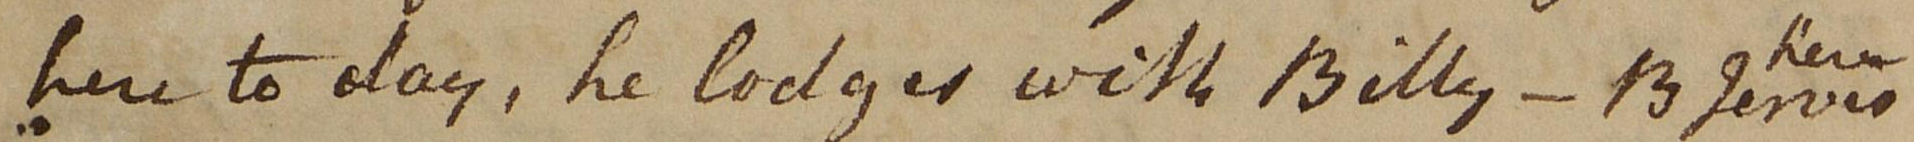here to day, he lodges with Billy- B Jervis
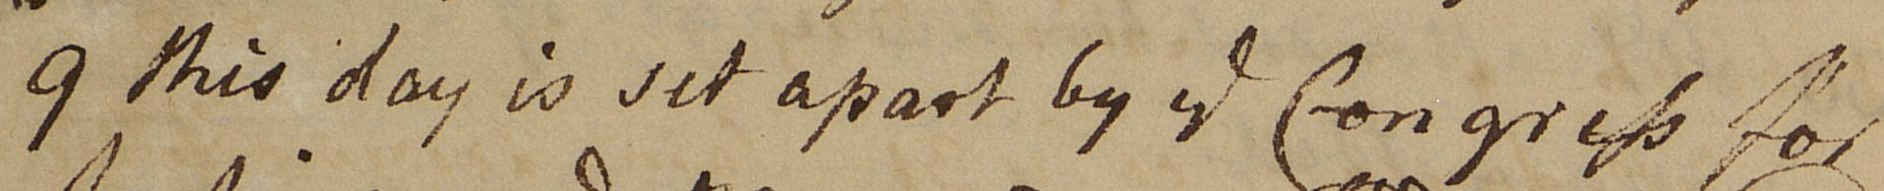9 this day is set apart by y^e Congress for
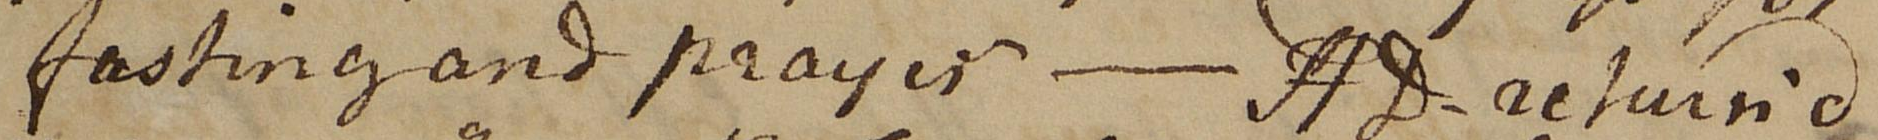fasting and prayer- HD- return'd
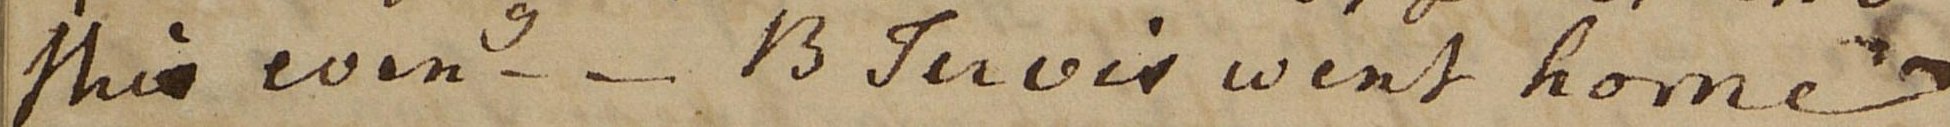this even^g-- B Jervis went home
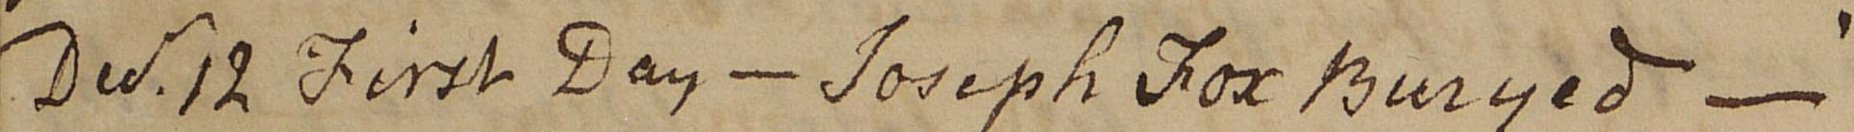Dec^r. 12 First Day- Joseph Fox Buryed-
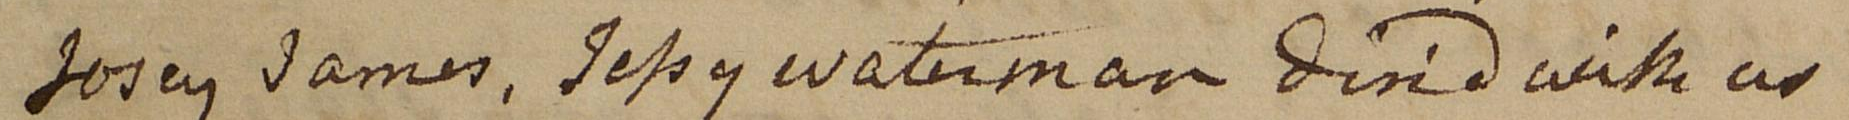Josey James, Jesy Waterman din'd with us
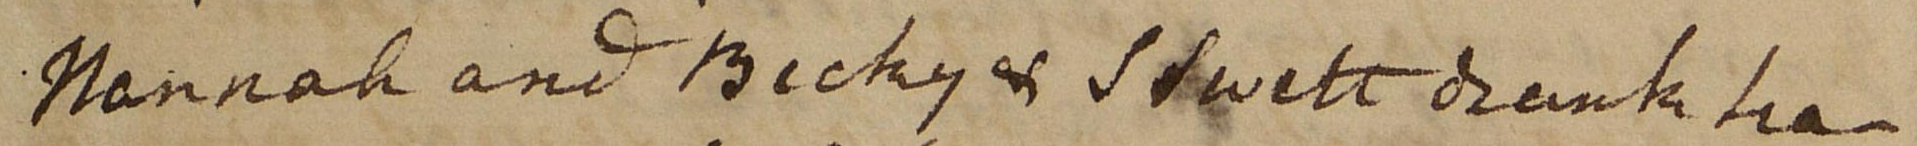Hannah and Becky & S Swett drank tea-
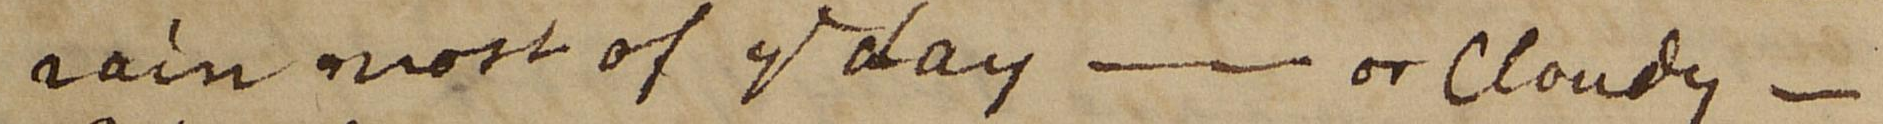rain most of y^e day- or Cloudy-
